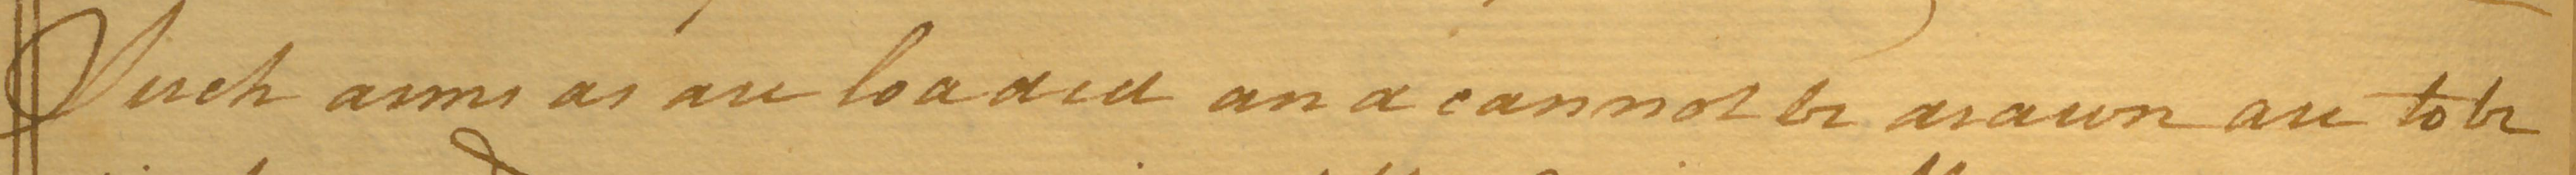Such arms as are loaded and cannot be drawn are to be
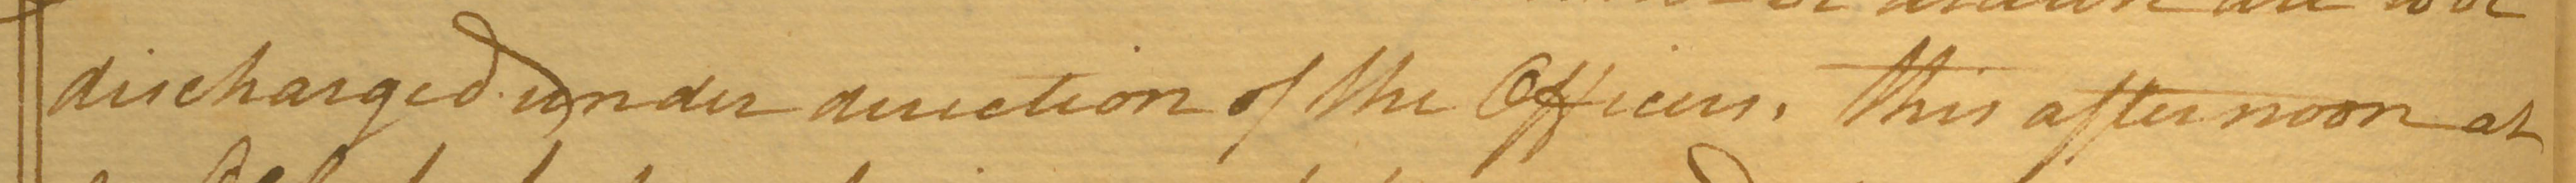discharged under direction of the Officers, this afternoon at
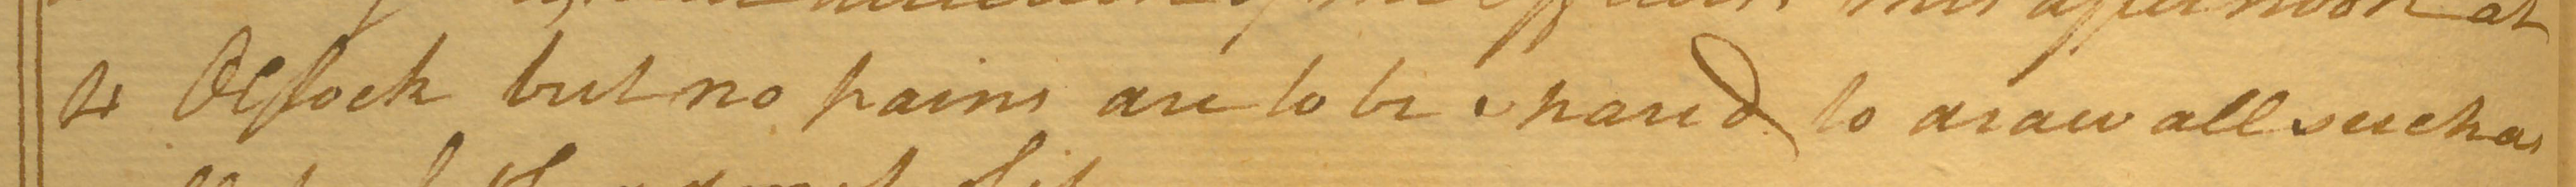4 OClock but no pains are to be spared to draw all such as
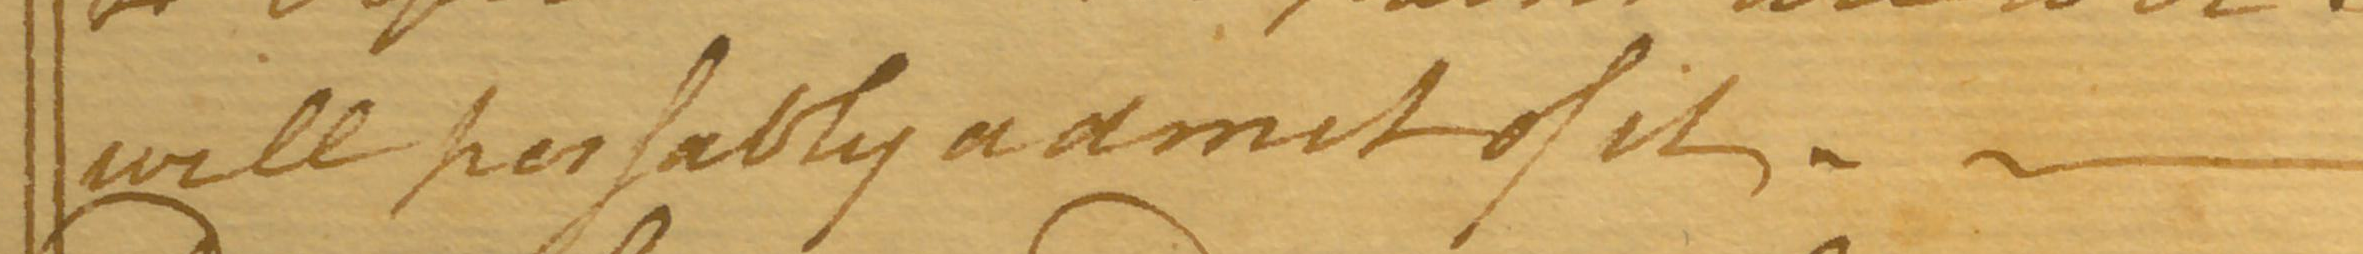will perfectly admit of it. -
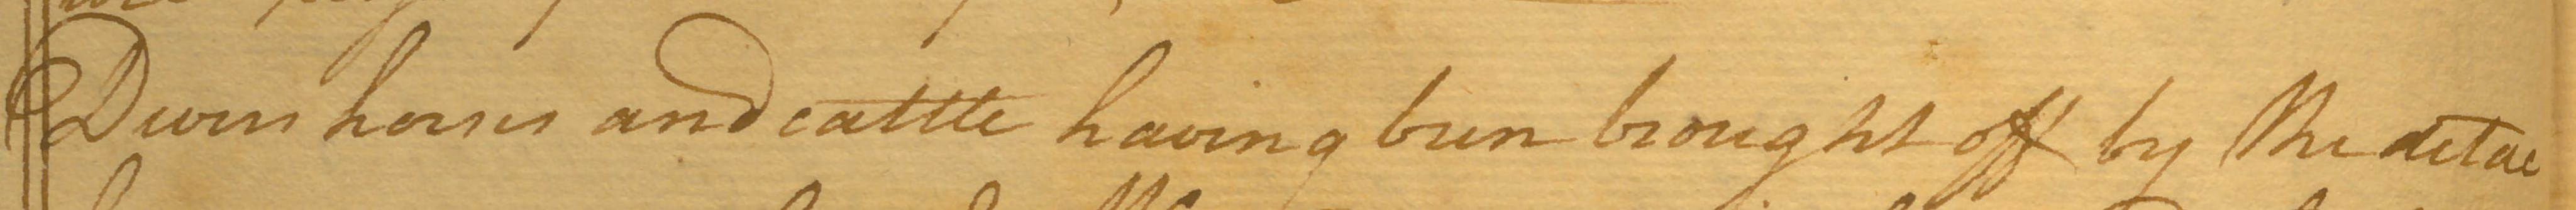Divers horses and cattle having been bought off by the detac
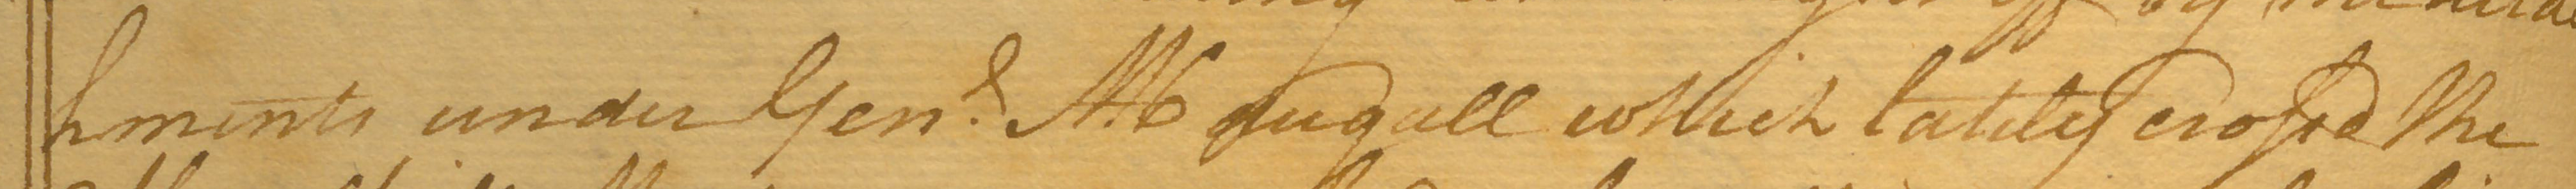hments under Gen^l. MCdugall which lately crossed the
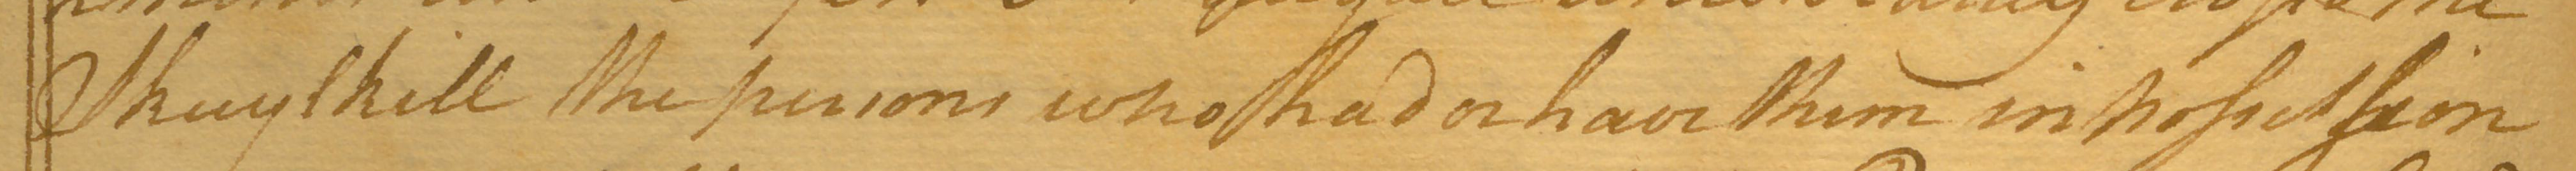Skuylkill the persons who had or have them in possession
